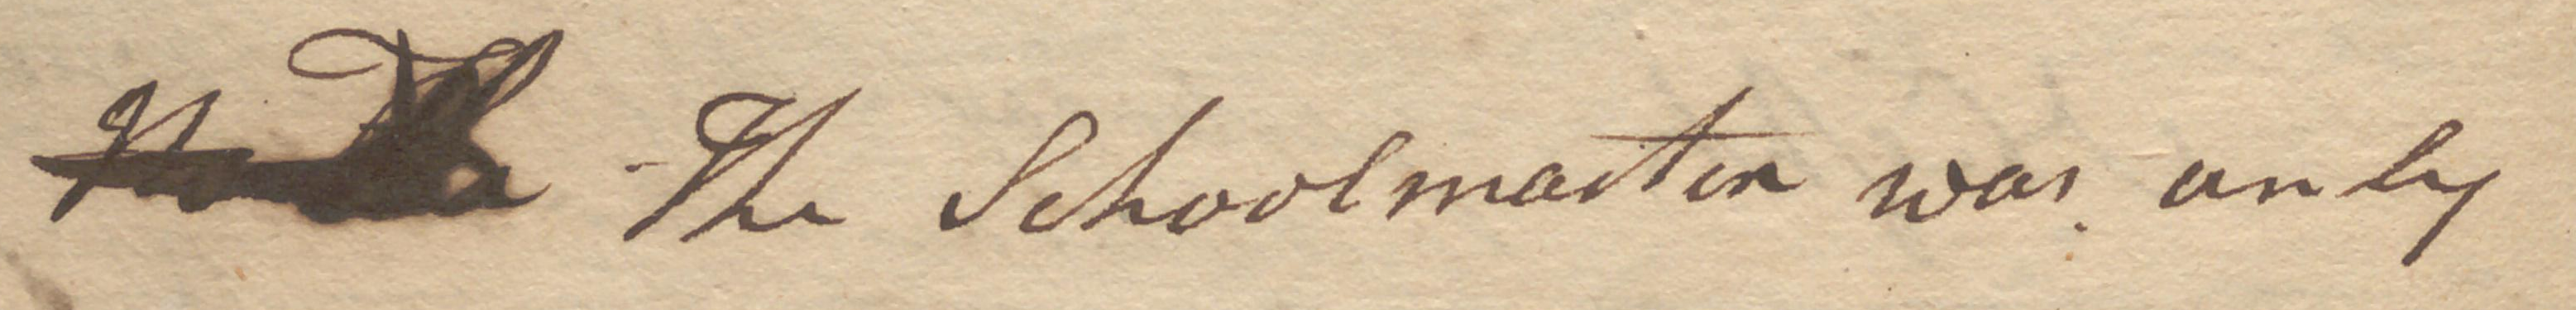[______] The Schoolmaster was anly
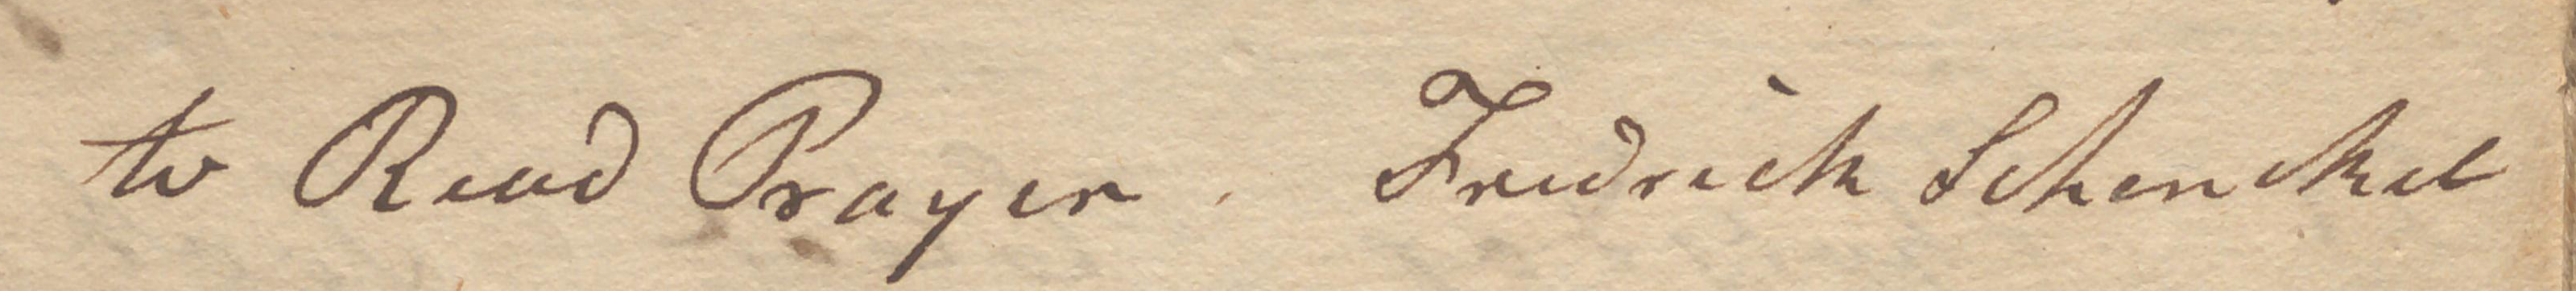to Read Prayer. Fredrick Schenckel
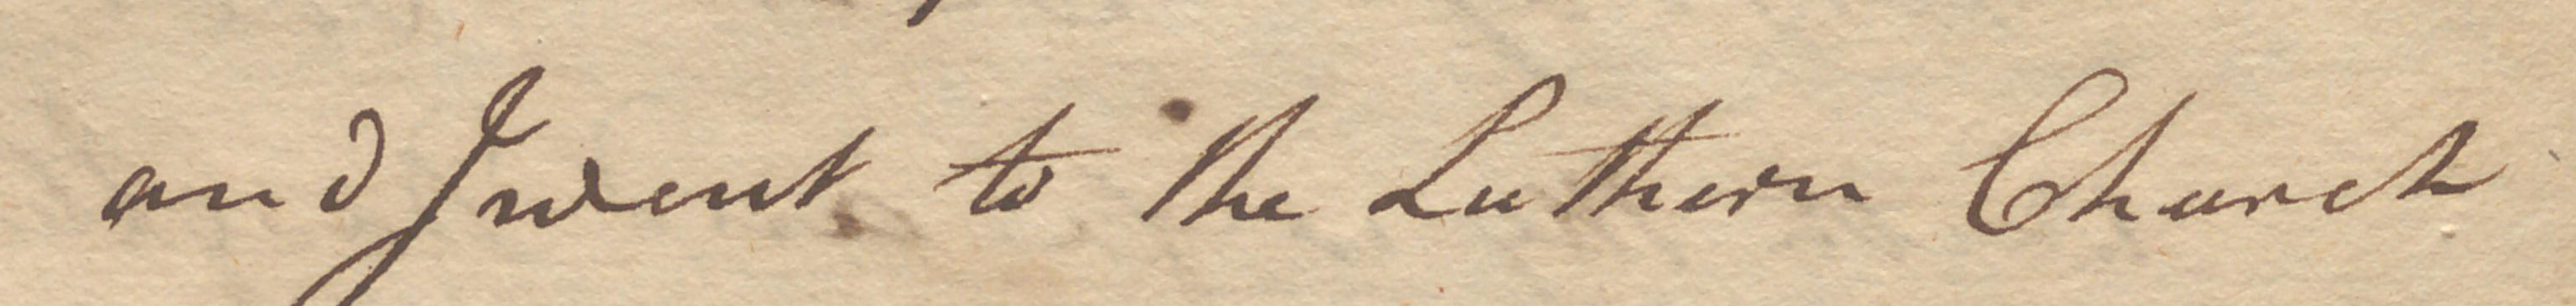and I went to the Luthern Charch
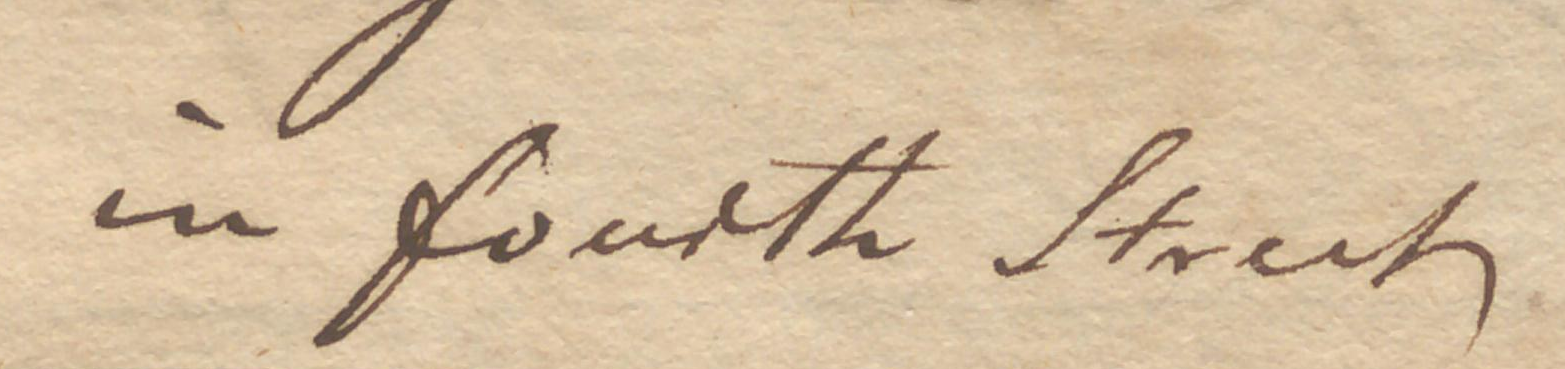in fourth Street
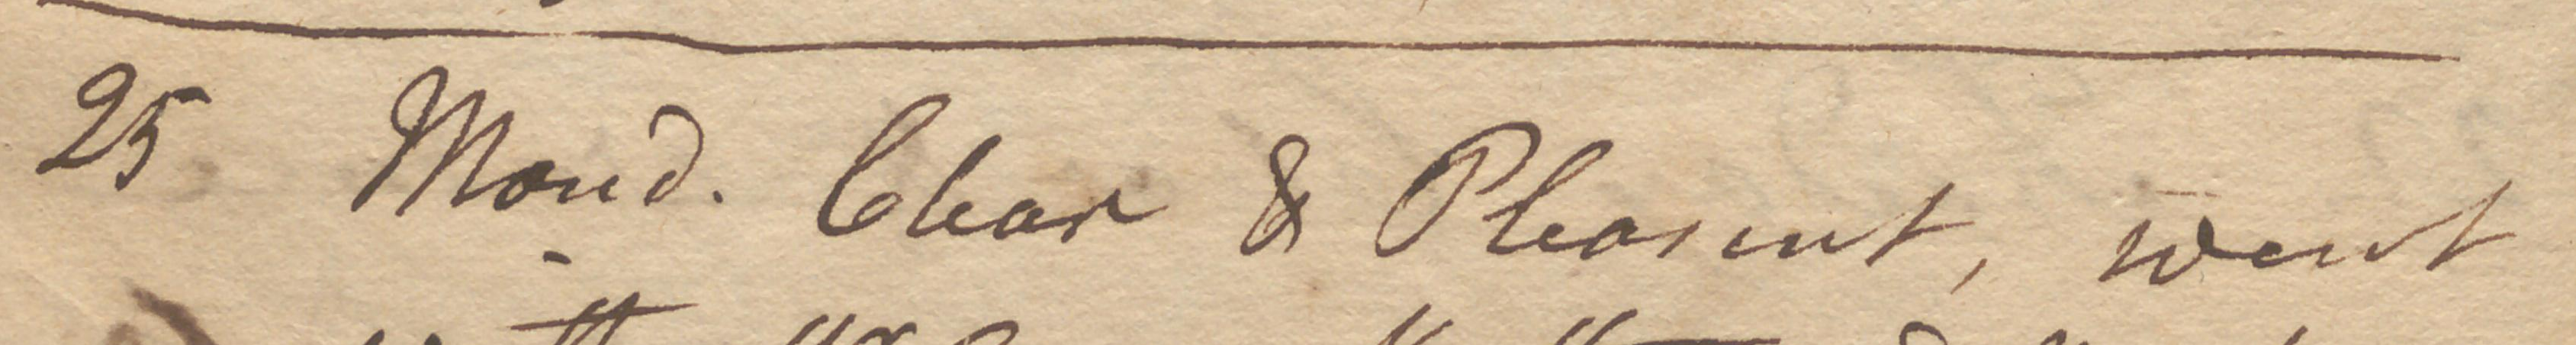25 Mond. Clear & Pleasent, went
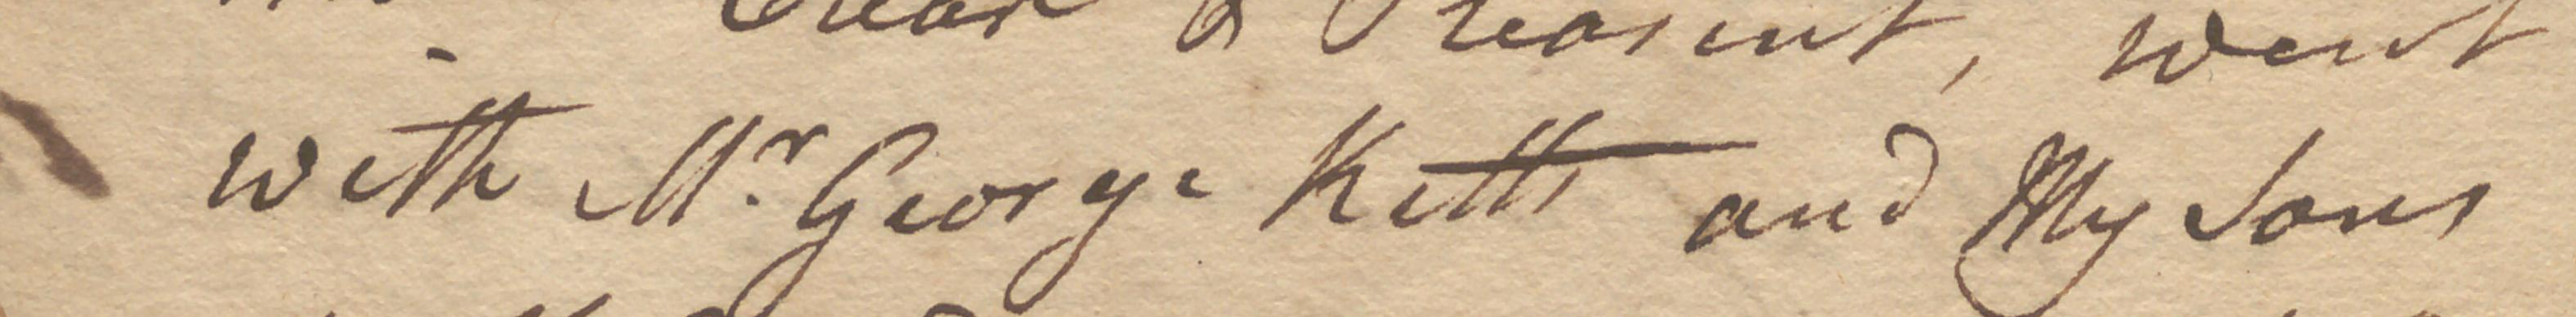with M^r. George Kitts and My sons
